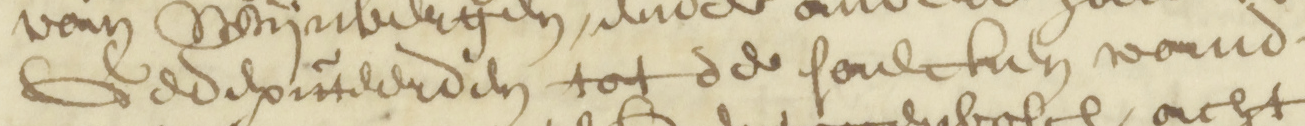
Gedeputeerden tot de saecken vande
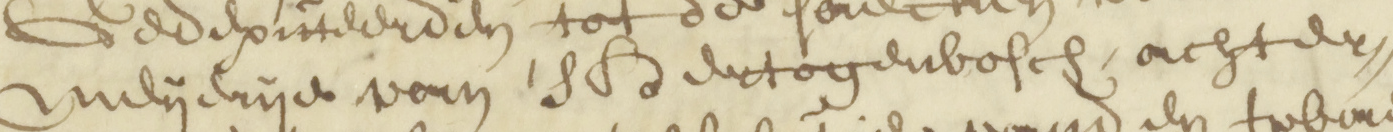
Meijerije van ‛s Hertogenbosch, achter„
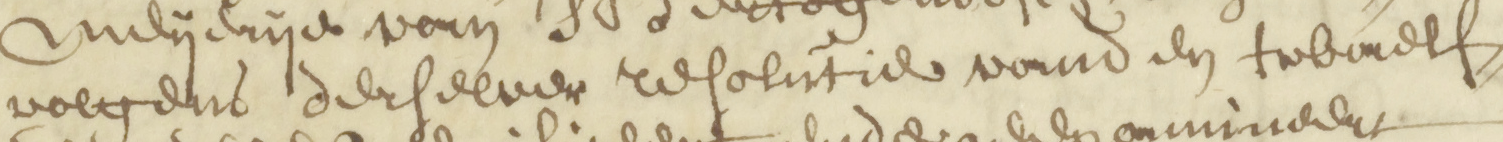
volgens derselver resolutie vanden twaelf„
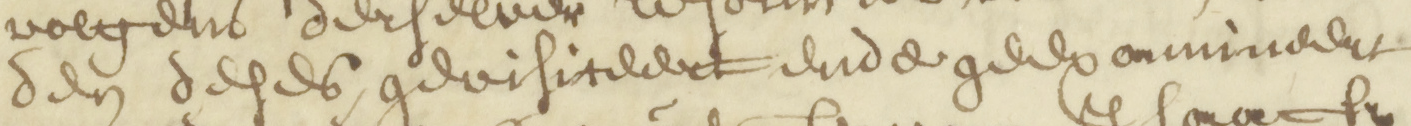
den deses, gevisiteert ende geexamineert
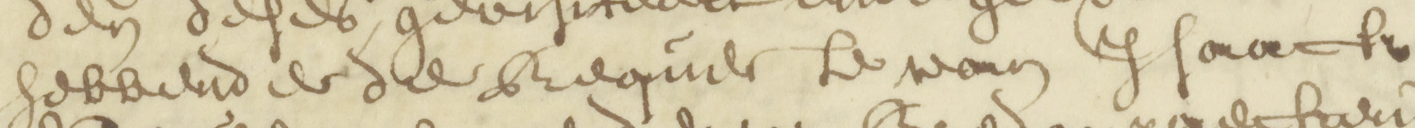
hebbende de Requeste van Isaack
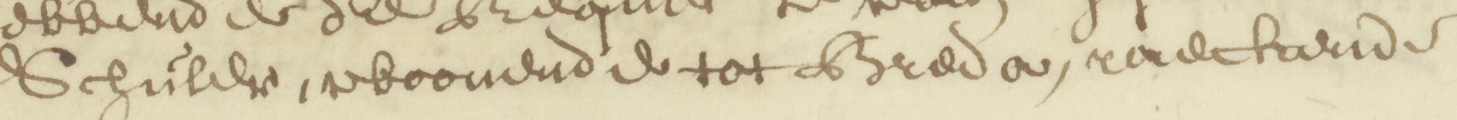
Schuler, woonende tot Breda, raeckende
